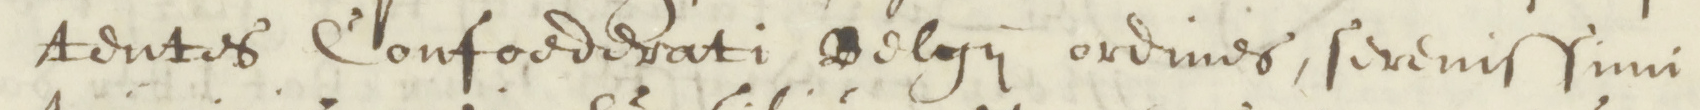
tentes Confoederati Belgii ordines, serenissimi
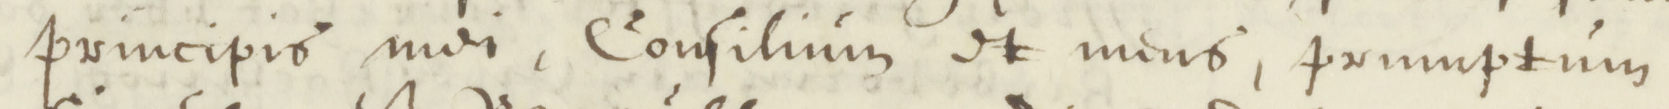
principis mei, Consilium et mens, promptum
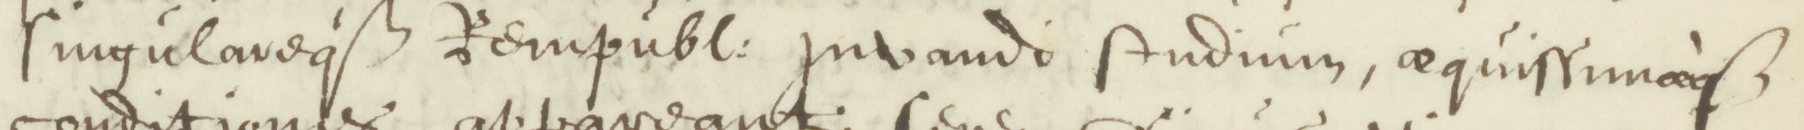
singulareq Rempubl: Iuvandi studium, æquissimæq
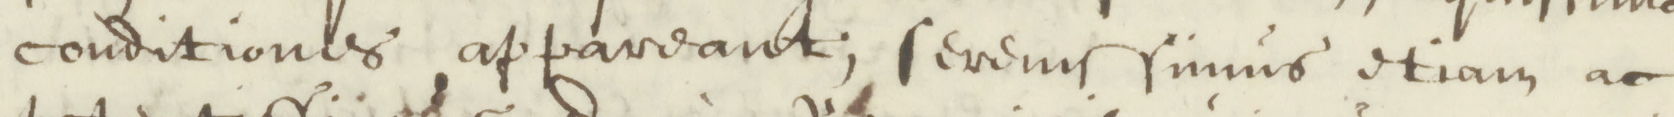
conditiones appareant, serenissimus etiam ac
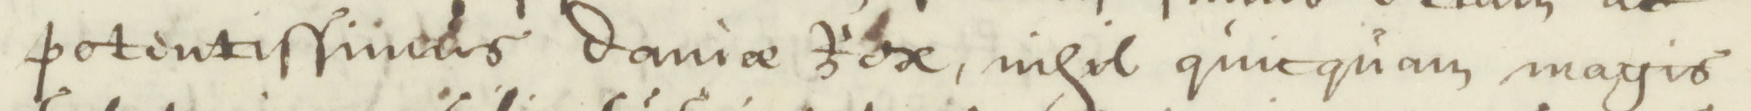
potentissimus daniæ Rex, nihil quicquam magis
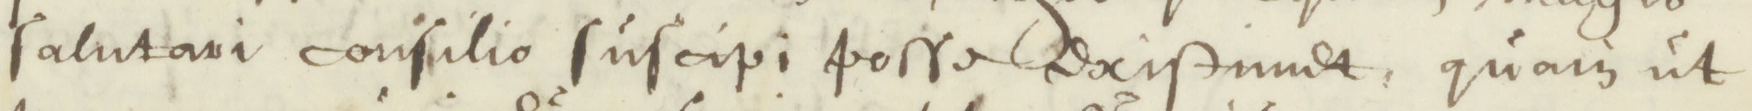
salutari consilio suscipi posse existimet, quam ut
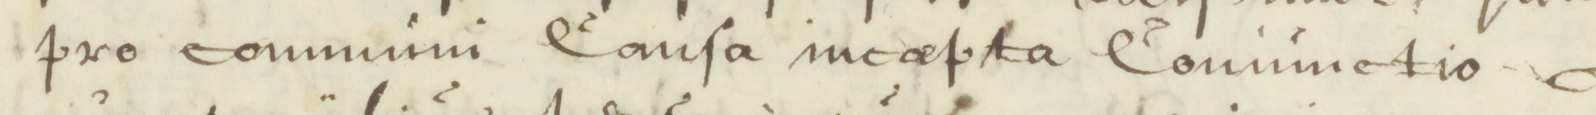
pro communi Causa incæpta Coniunctio
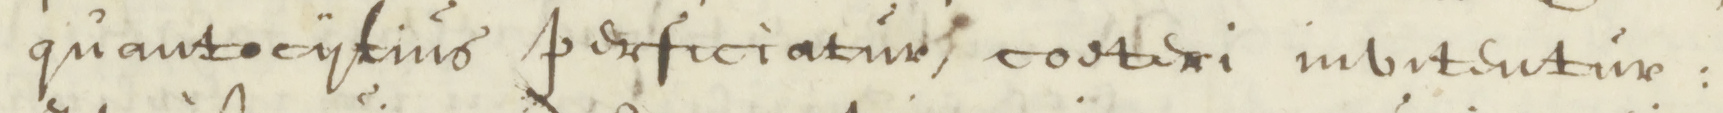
quanto cytius perficiatur, coeteri invitentur:
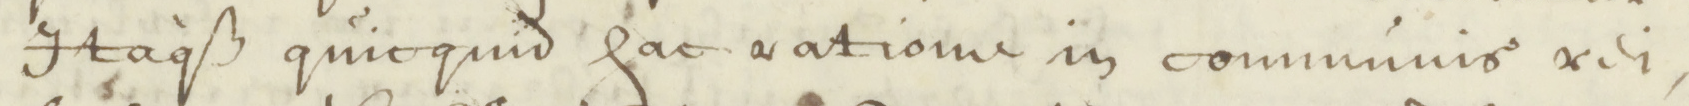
Itaq quicquid hac ratione in communis rei
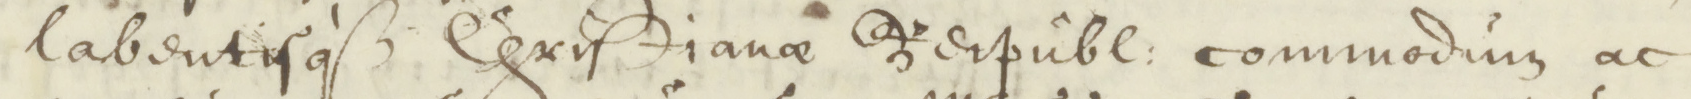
labentisq Christianæ Reipubl: commodum ac
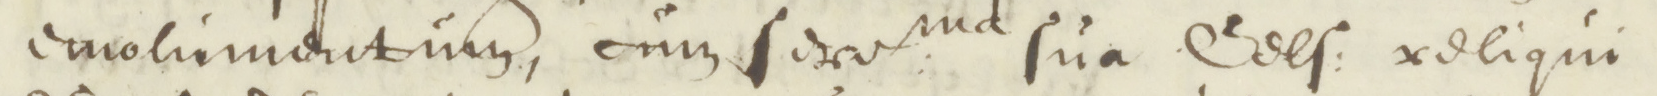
emolumentum, cum serema: sua Cels. reliqui
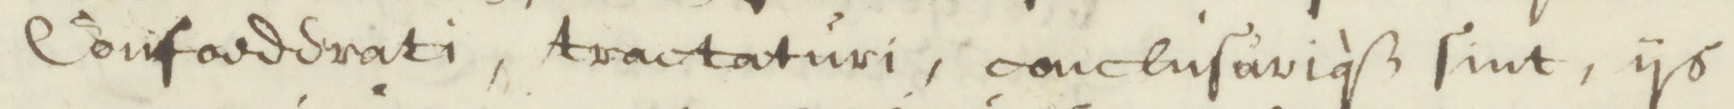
Confoederati, tractaturi, conclusariq sint, iis
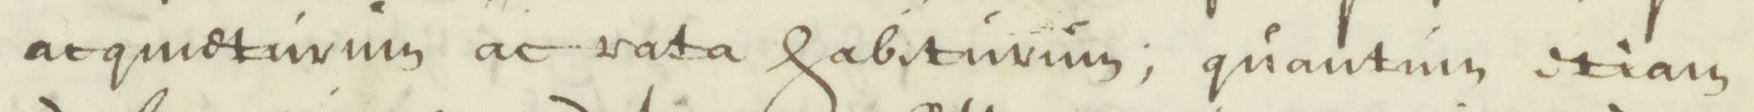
acquieturum ac rata habiturum; quantum etiam
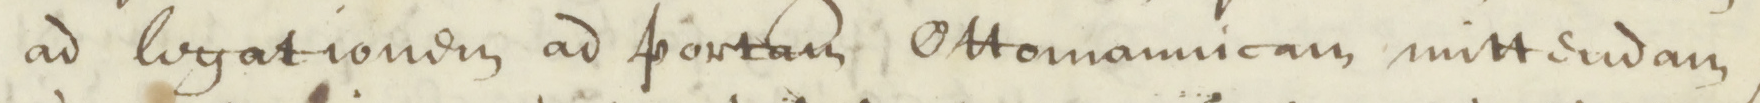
ad legationem ad portam Ottomaninicam mittendam,
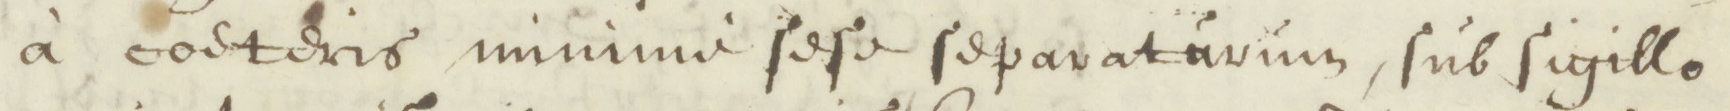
a coeteris minime sese separaturum, sub sigillo
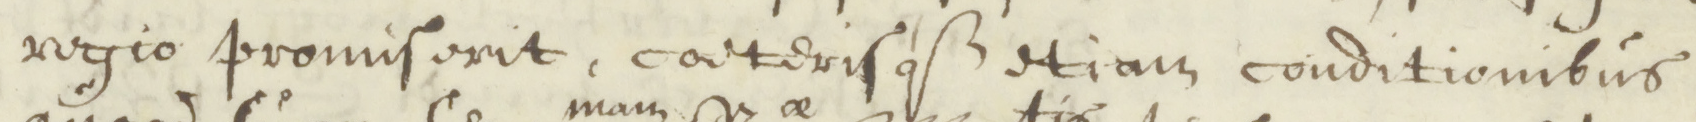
regio promiserit, coeterisq etiam conditionibus
